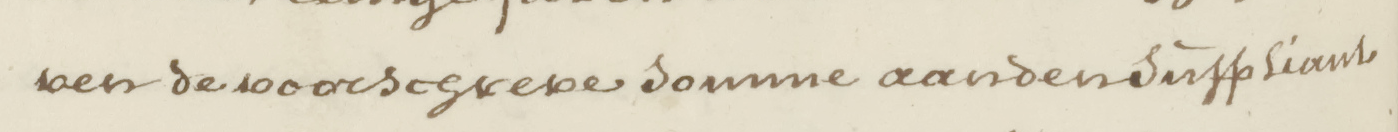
ven de voorschreve somme aan den suppliant
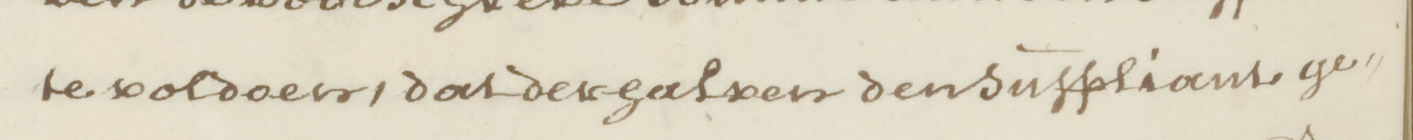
te voldoen, dat derhalven den suppliant ge,,
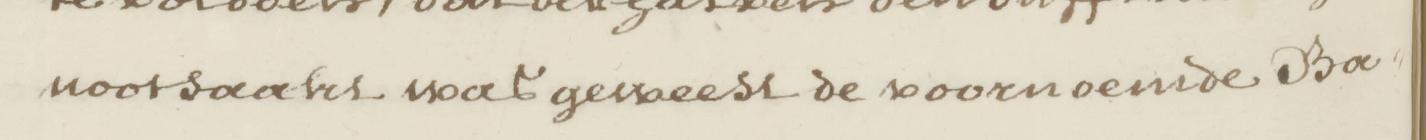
nootsaakt was geweest de voornoemde Ba„,
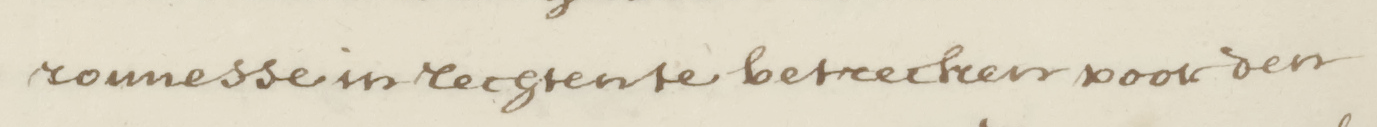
ronnesse in rechten te betrecken voor den
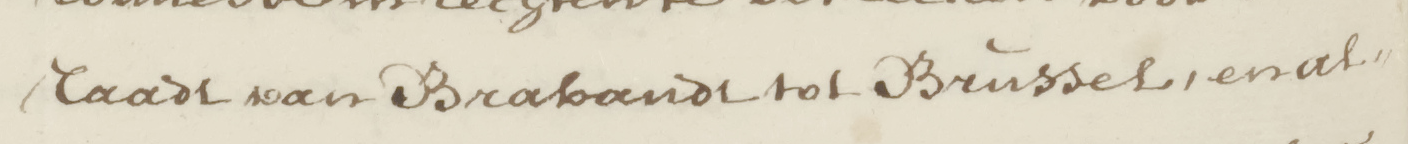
Raadt van Brabandt tot Brussel, en al„
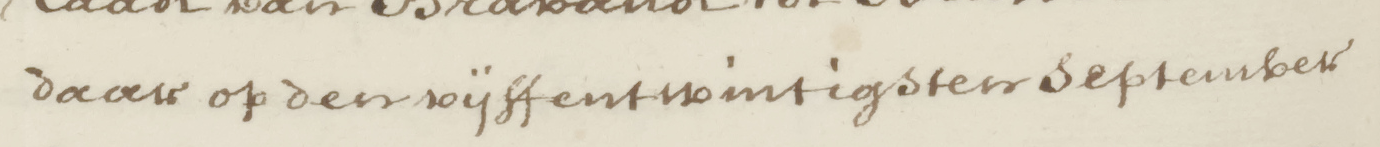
daar op den vijffentwintigsten september
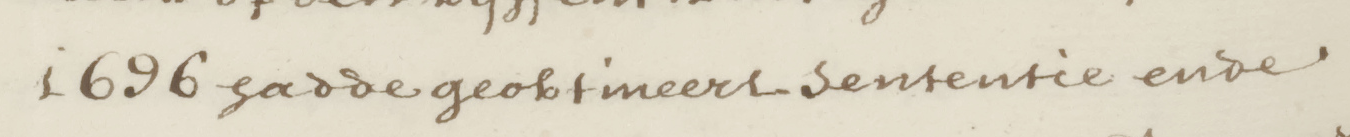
1696 hadde geobtineert sententie ende
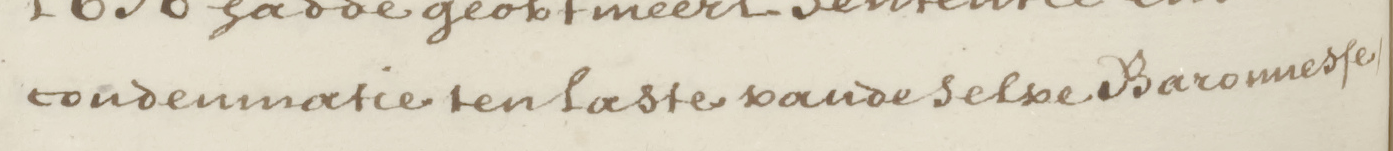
condemnatie ten laste vande selve Baronnesse
